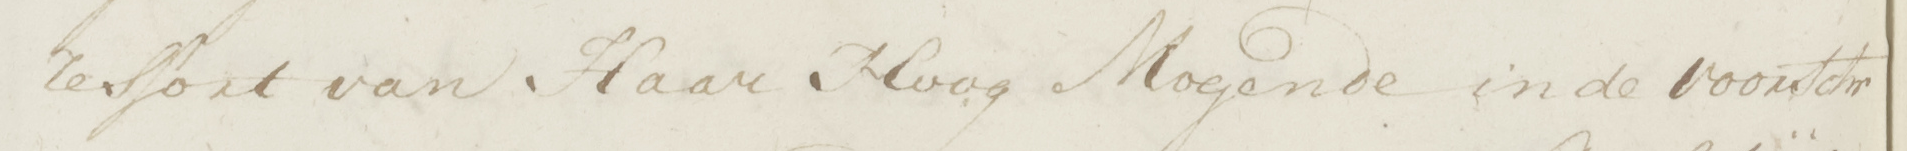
ressort van Haar Hoog Mogende ende voorschr
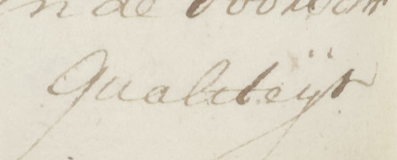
qualiteyt
